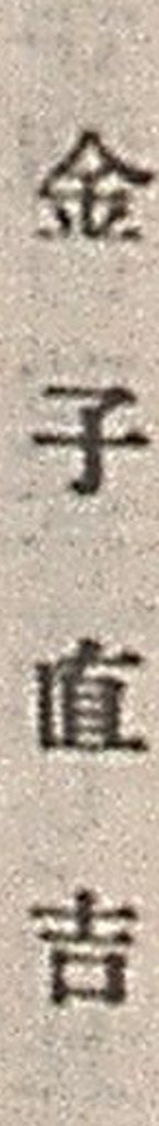金子直吉
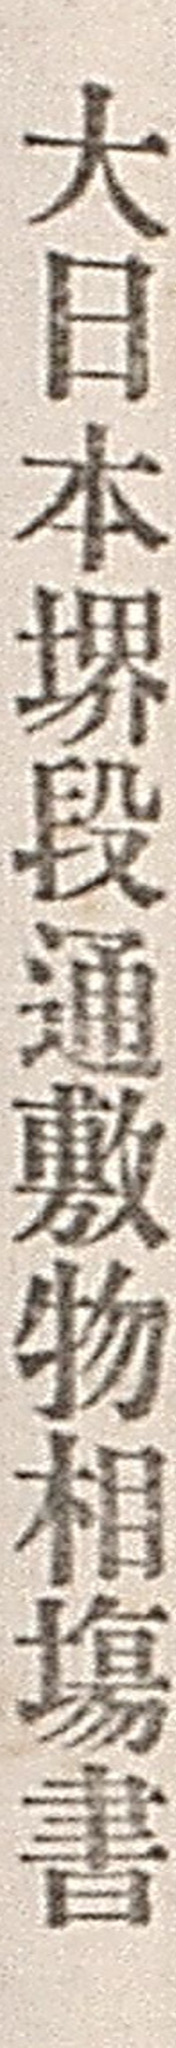大日本堺段通敷物相場書
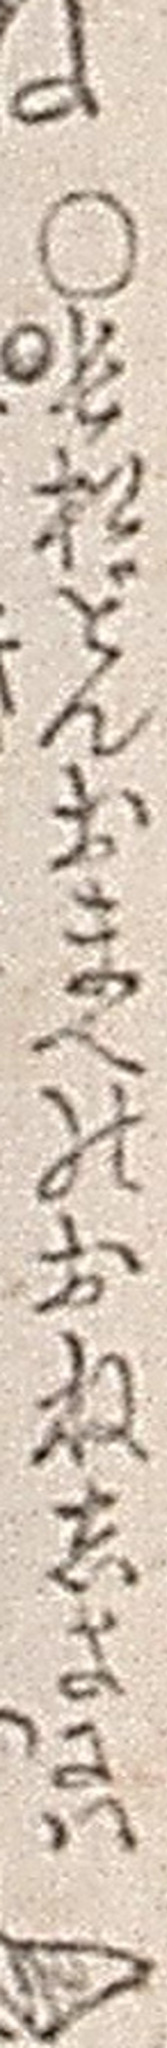◯長松どんおまへのおねしよには
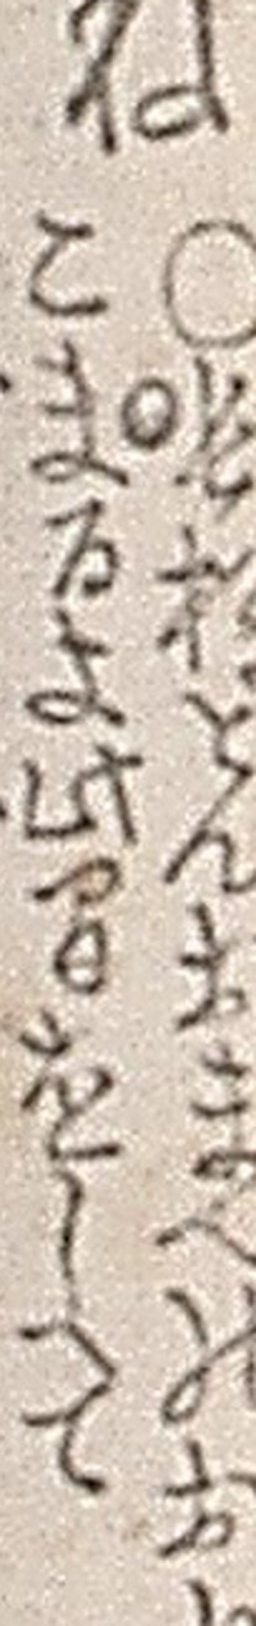こまるよ此間をしへて
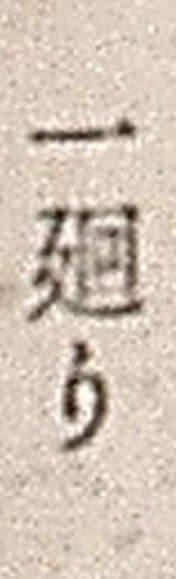一廻り
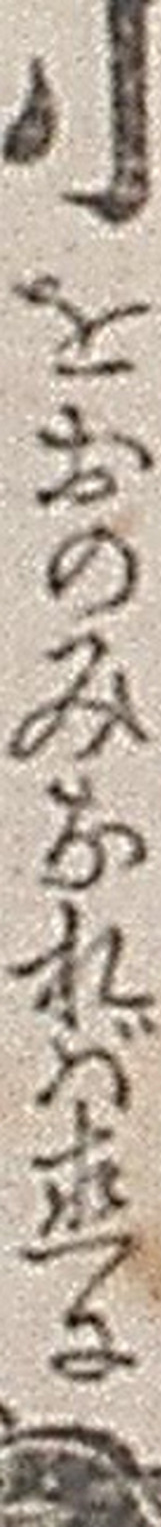をおのみなれば直に
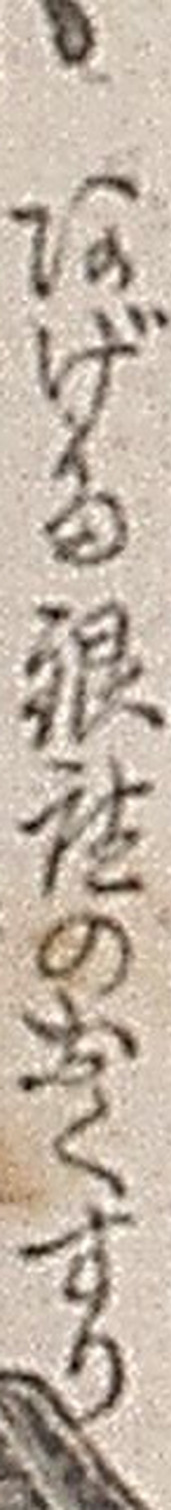あげた銀座のおくすり
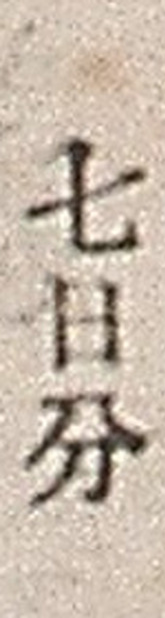七日分
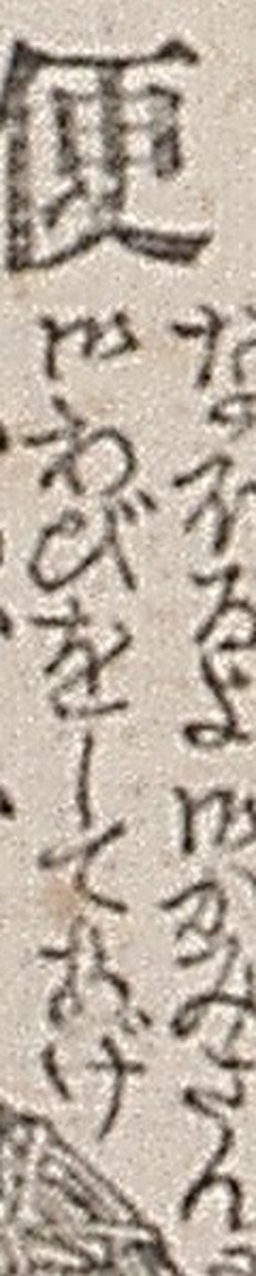御わびをしてあげ
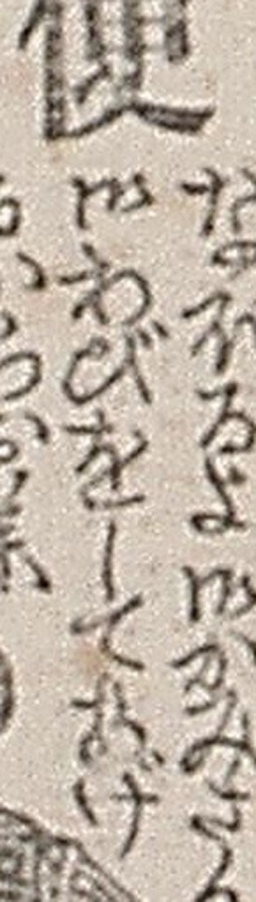御わびをしてあげ
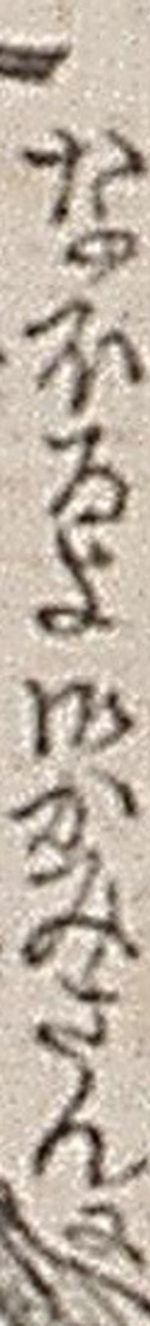なほるよ御かみさんに
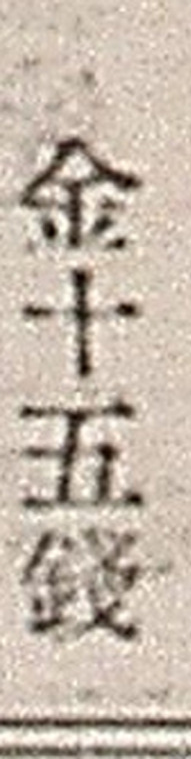金十五銭
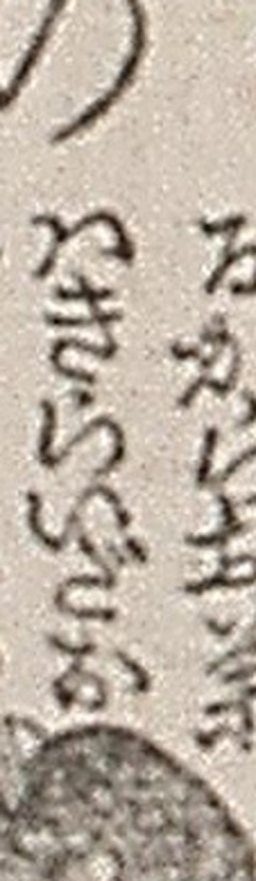はきらいだお
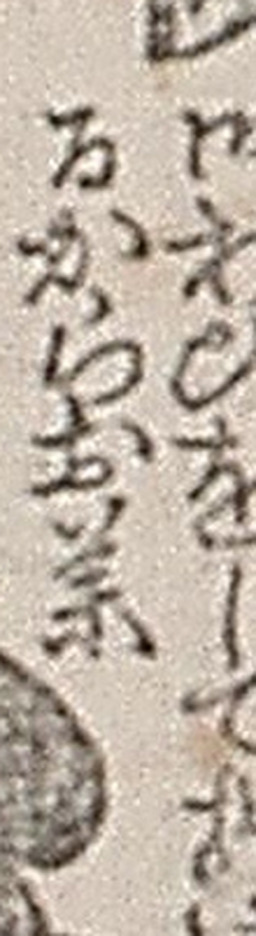るからお薬
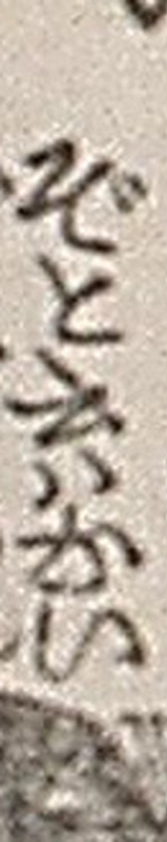ぞといはない
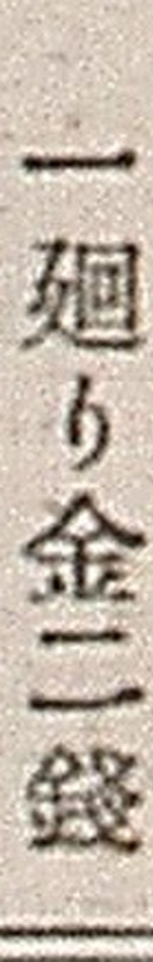一廻り金二銭
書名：風俗畫報臨時増刊第百二十八號　洪水被害録（下）
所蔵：東京大学地震研究所図書室 Earthquake Research Institute Library, The University of Tokyo, JAPAN
